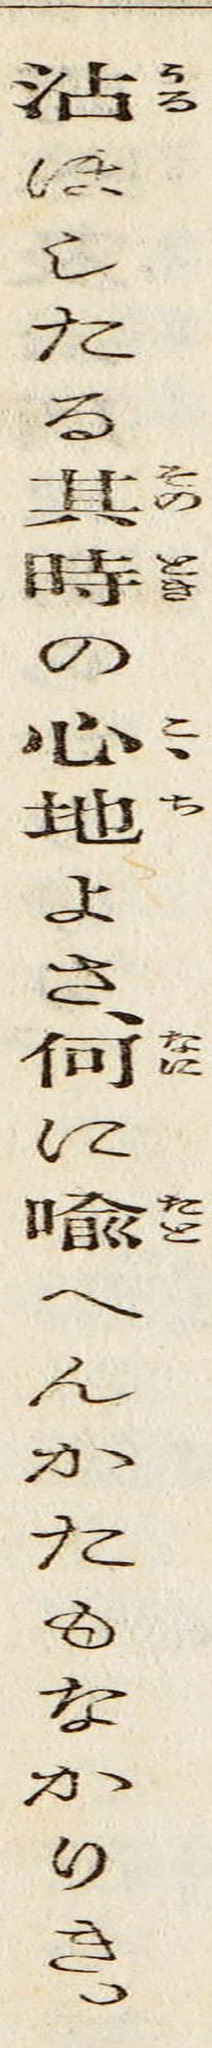沾ほしたる其時の心地よさ、何に喩へんかたもなかりき。
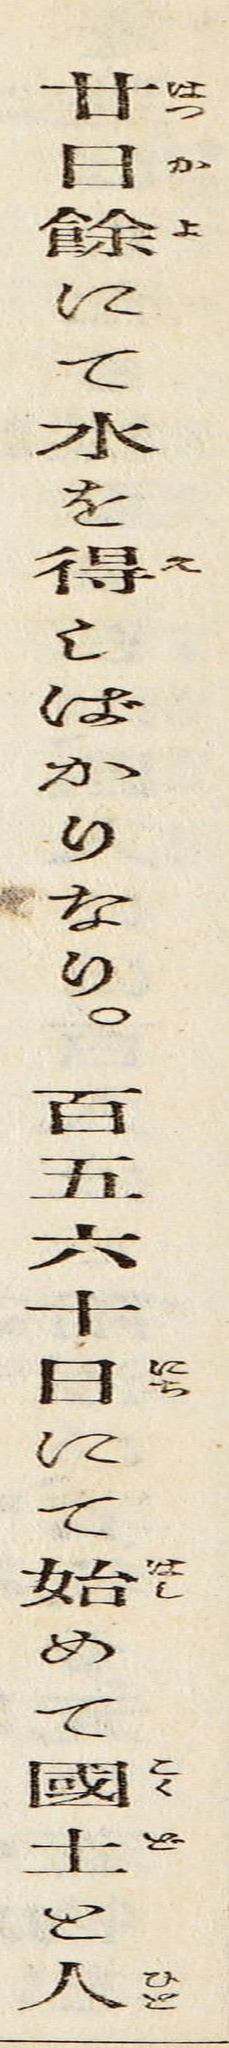廿日余にて水を得しばかりなり。百五六十日にて始めて国土と人
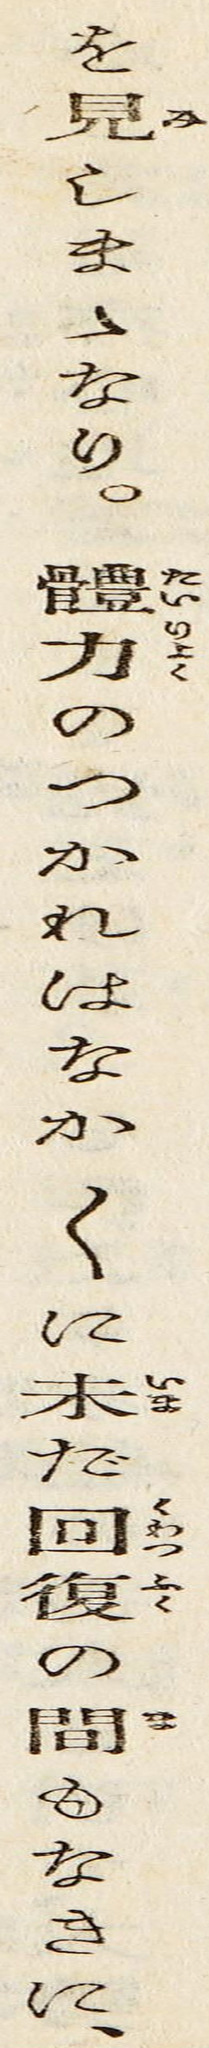を見しまゝなり。体力のつかれはなか〳〵に未だ回復の間もなきに、
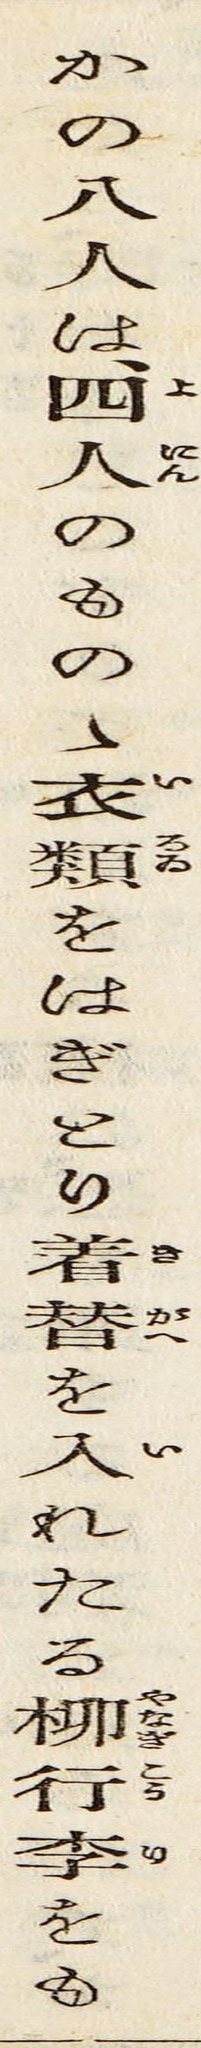かの八人は、四人のものゝ衣類をはぎとり着替を入れたる柳行李をも
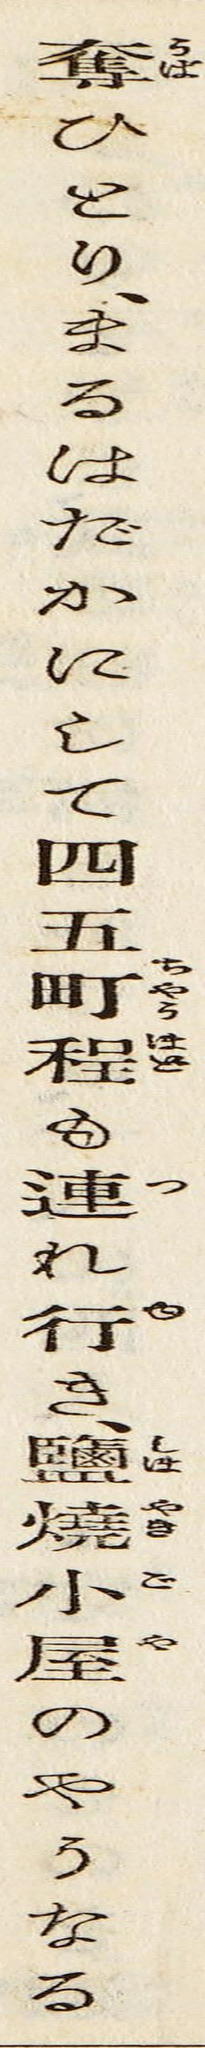奪ひとり、まるはだかにして四五町程も連れ行き、塩焼小屋のやうなる
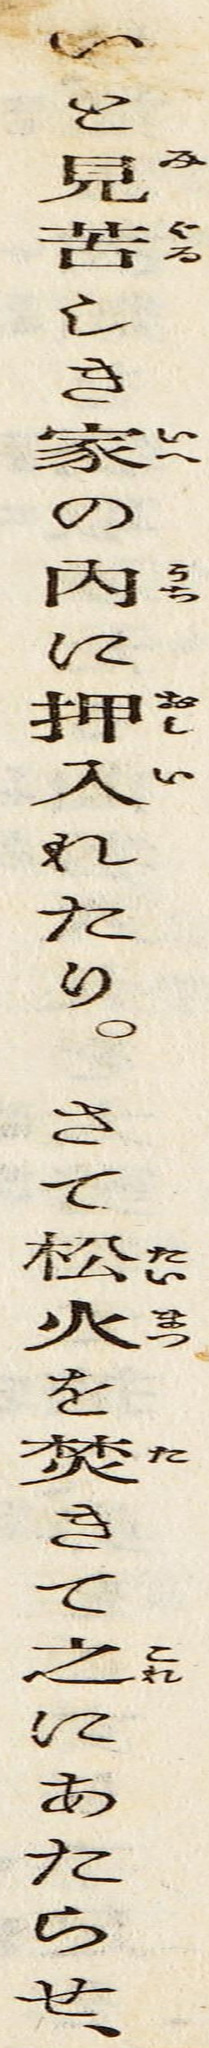いと見苦しき家の内に押入れたり。さて松火を焚きて之にあたらせ、
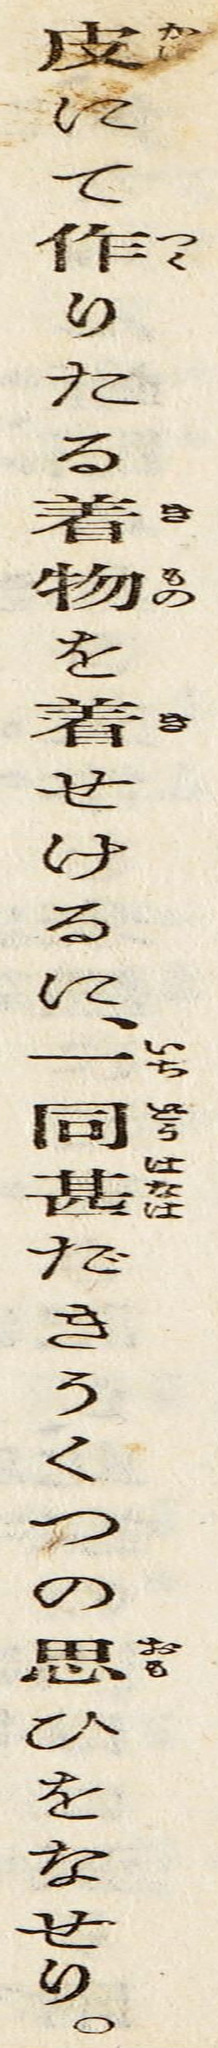皮かにて作りたる着物を着せけるに、一同甚だきうくつの思ひをなせり。
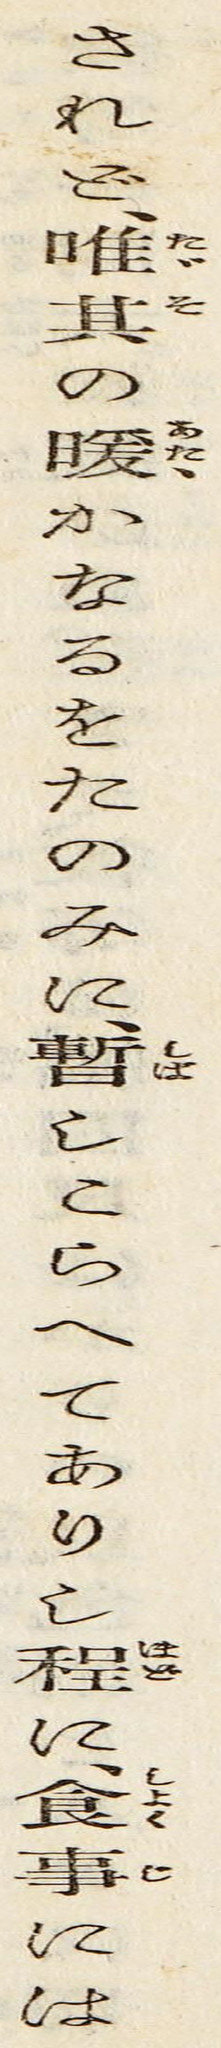されど、唯其の暖かなるをたのみに、暫しこらへてありし程に、食事には
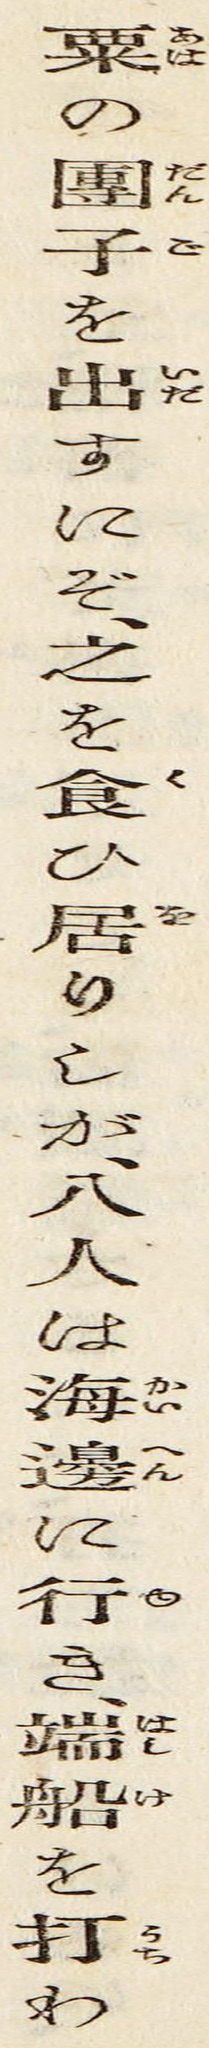粟の団子を出すにぞ、之を食ひ居りしが、八人は海辺に行き、端船を打わ
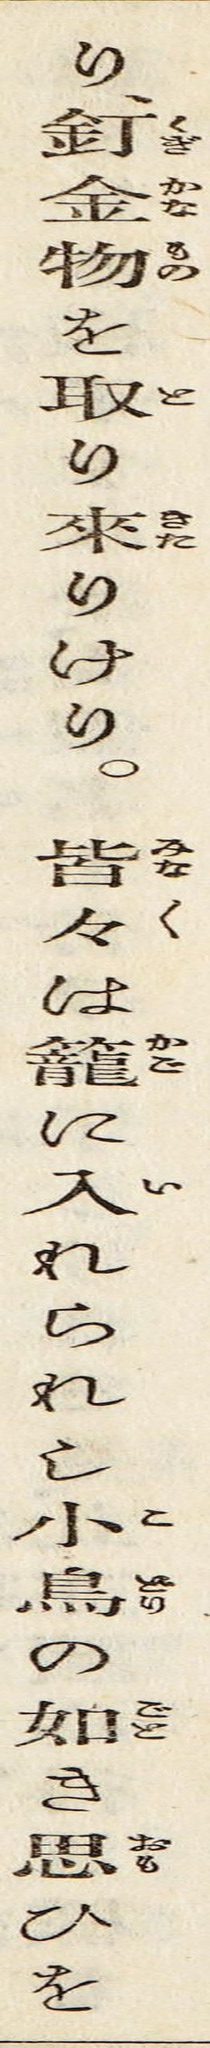り、釘金物を取り来りけり。皆々は籠に入れられし小鳥の如き思ひを
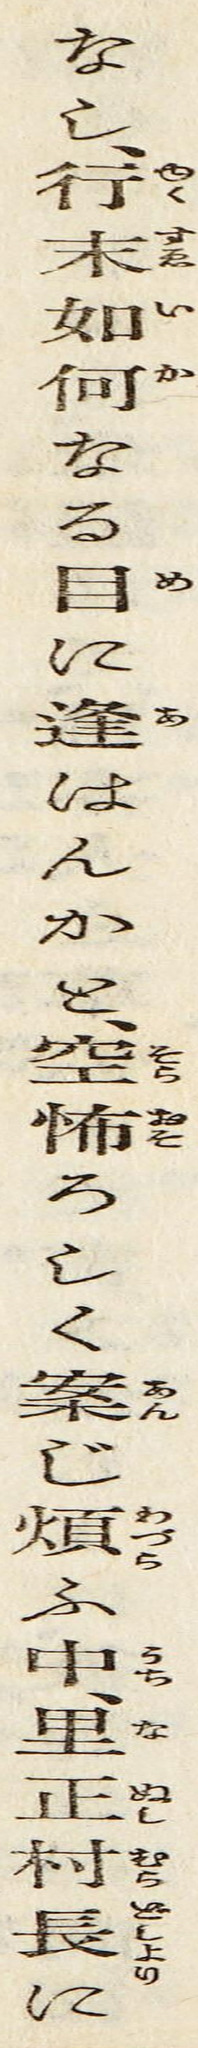なし、行末如何なる目に逢はんかと、空恐ろしく案じ煩ふ中、里正村長に
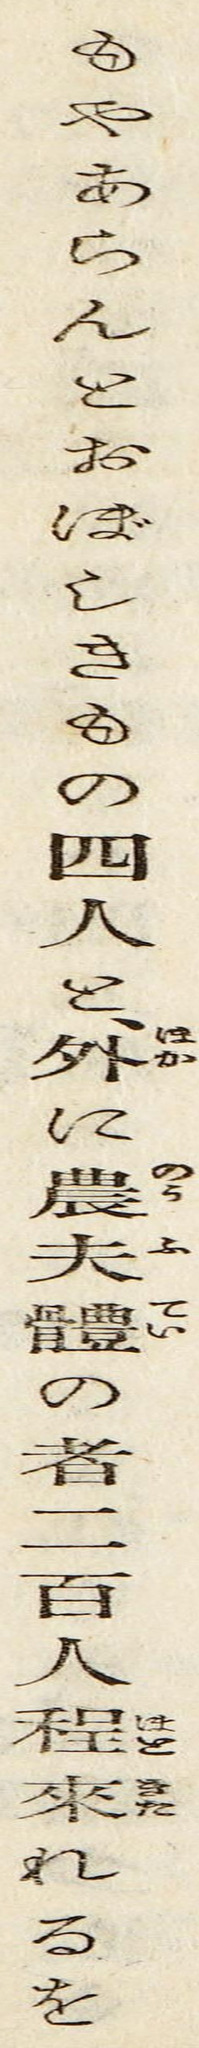もやあらんとおぼしきもの四人と、外に農夫体の者二百人程来れるを
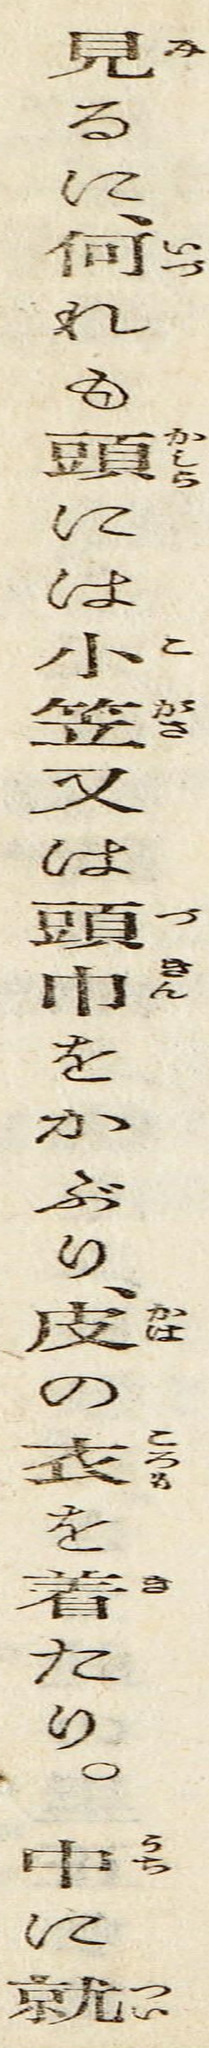見るに、何れも頭には小笠又は頭巾をかぶり、皮の衣を着たり。中に就

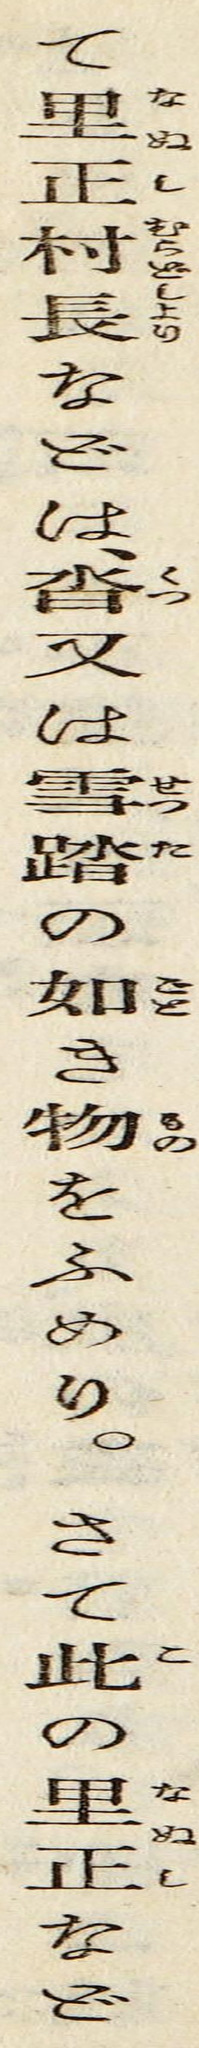て里正村長などは、沓又は雪踏の如き物をふめり。さて此の里正など
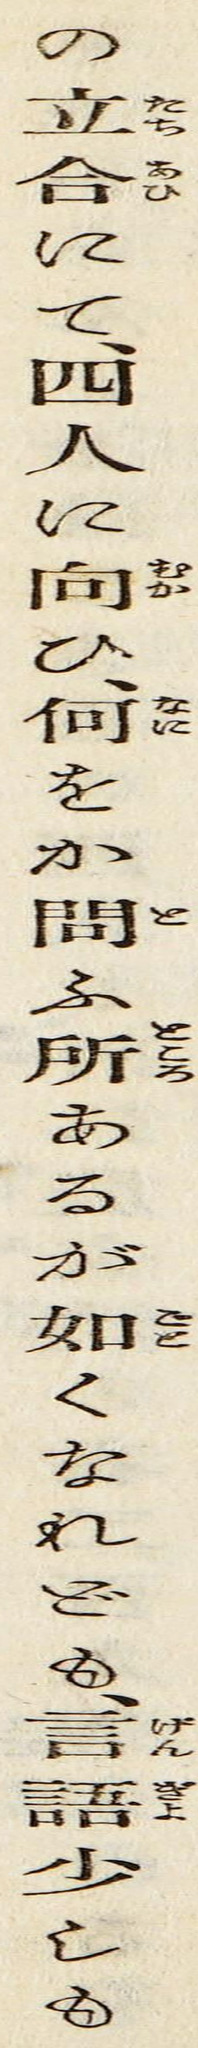の立合にて、四人に向ひ、何をか問ふ所あるが如くなれども、言語少しも
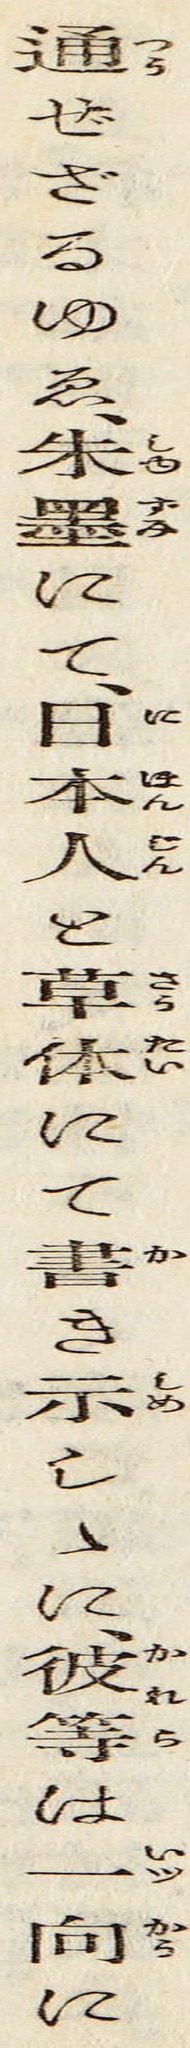通ぜざるゆゑ、朱墨にて、日本人と草体にて書き示しゝに、彼等は一向に
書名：日本漂流譚
